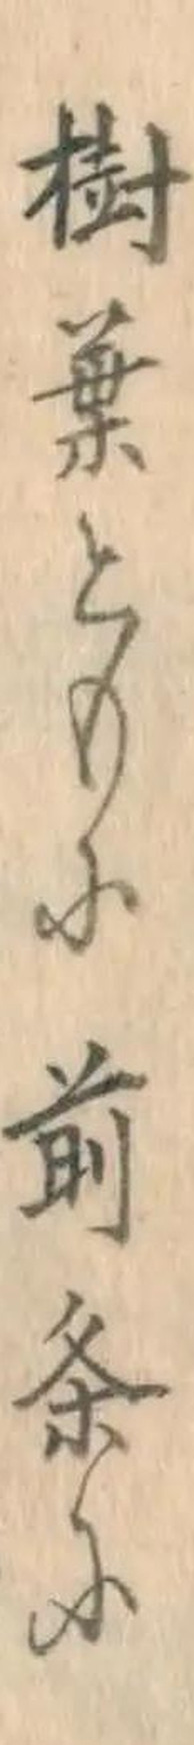樹葉ともに前条に
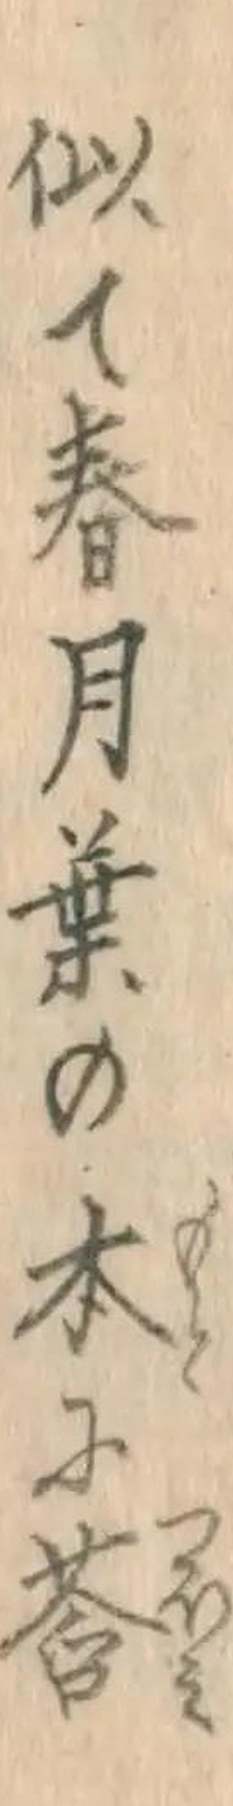似て春月葉の本に莟
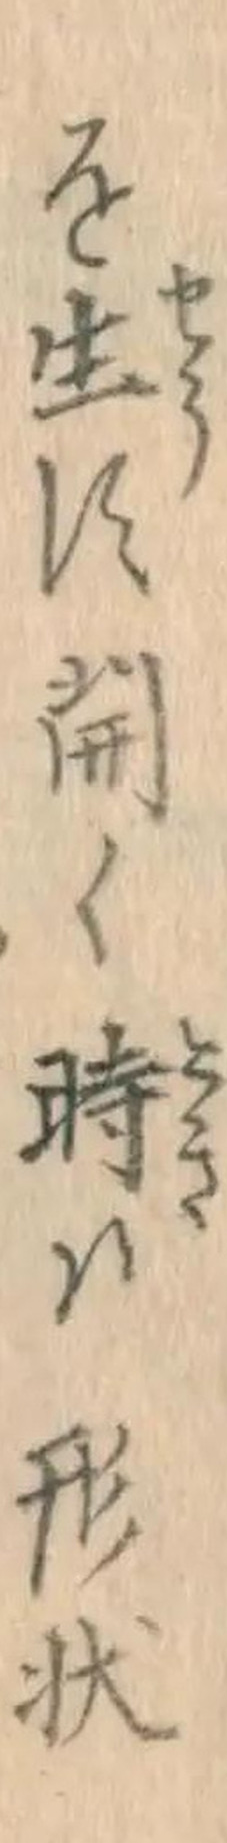を生す開く時は形状
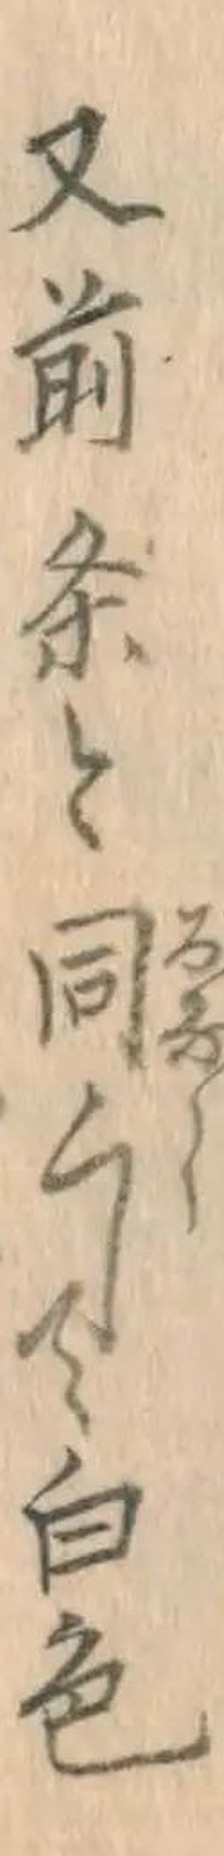又前条と同くして白色
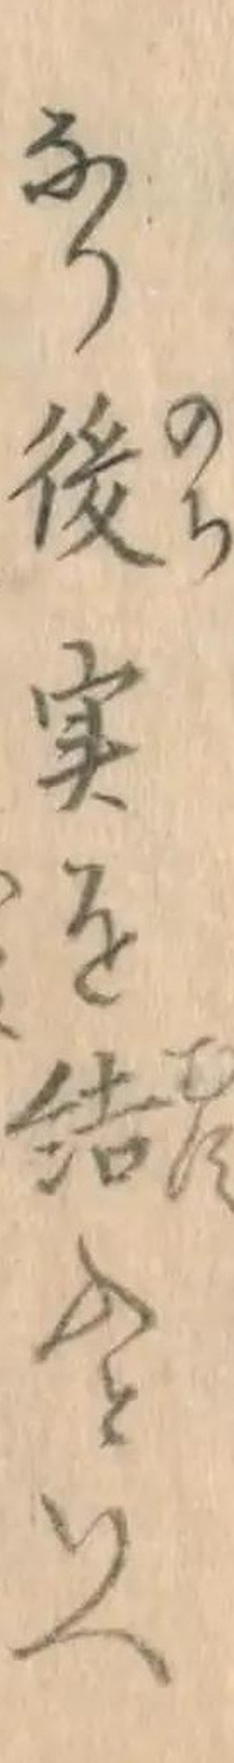なり後身を結ふといへ
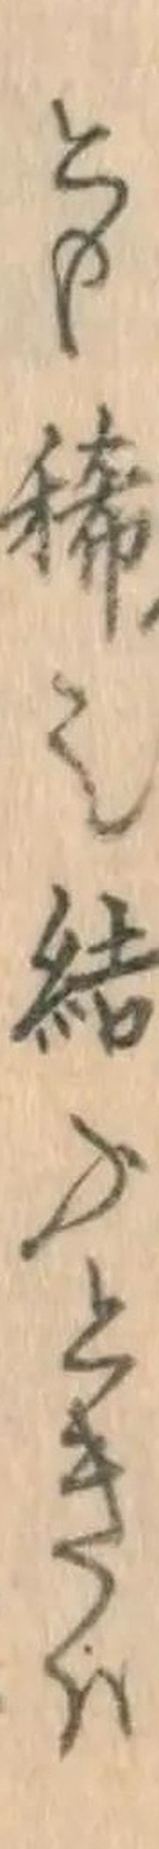とも稀也結ふときは
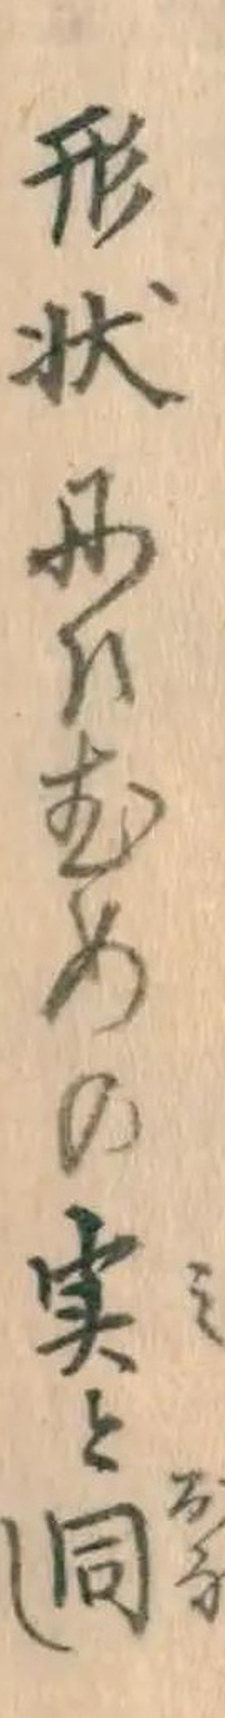形状にはむめの実と同し
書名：本草図譜. 巻88-90
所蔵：国立国会図書館 National Diet Library, JAPAN
